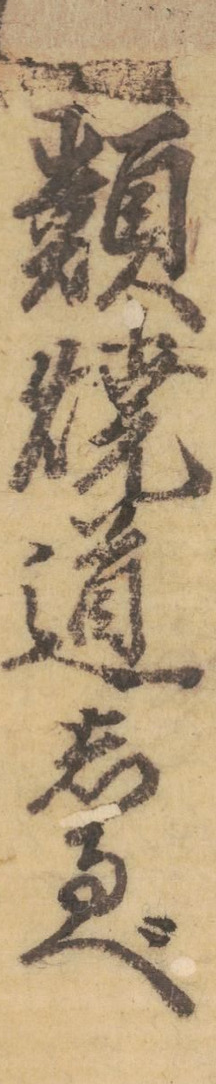類焼道しるべ
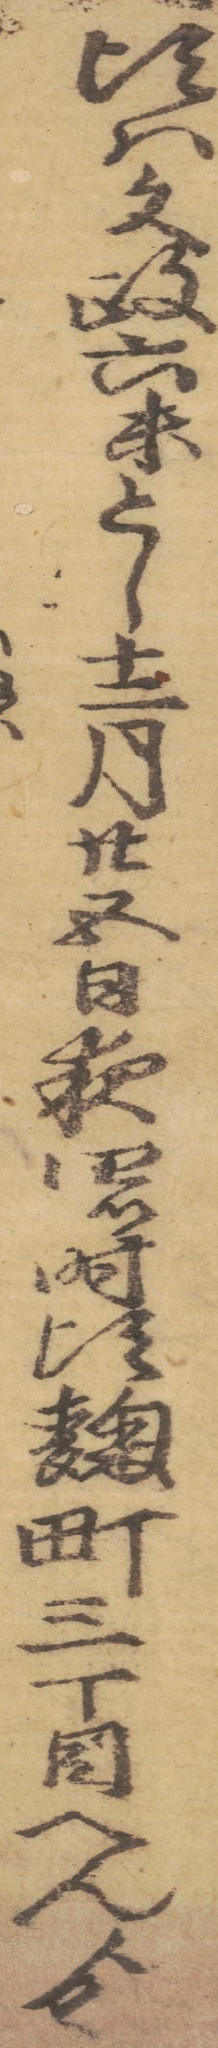頃は文政六未とし十二月廿五日夜四ツ時頃麹町三丁目へんゟ
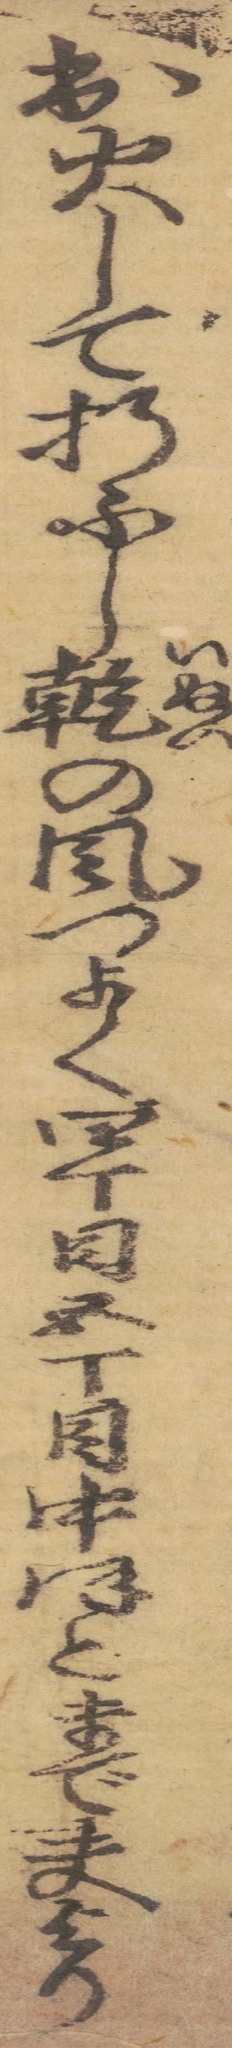出火して折ふし乾の風つよく四丁目五丁目中ほどまで夫より
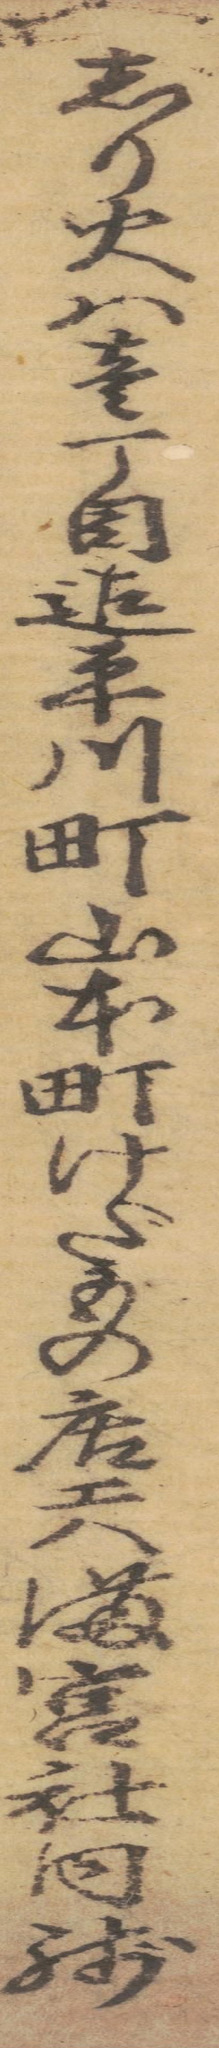しり火は壱丁目迄平川町山本町けだもの店天満宮社内残
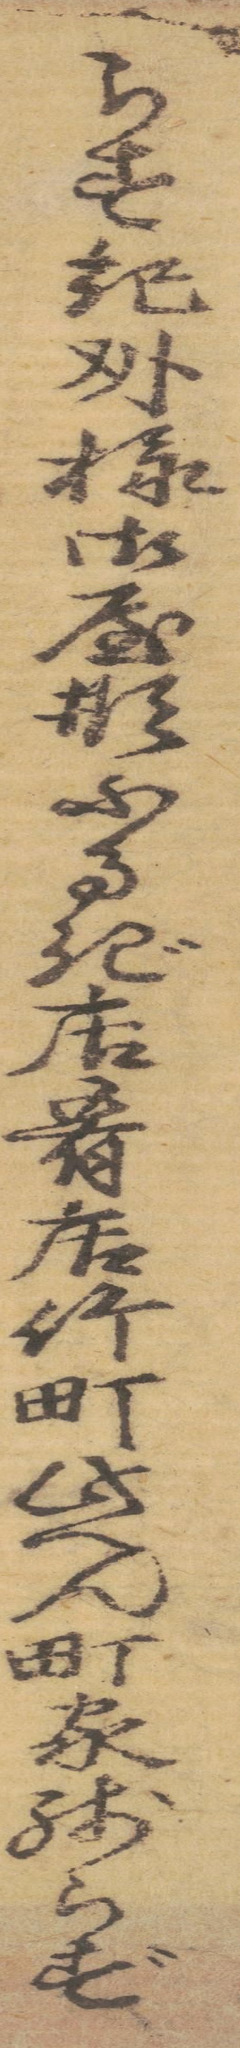らす紀州様御屋形ふるぎ店肴店竹町此へん町家残らず
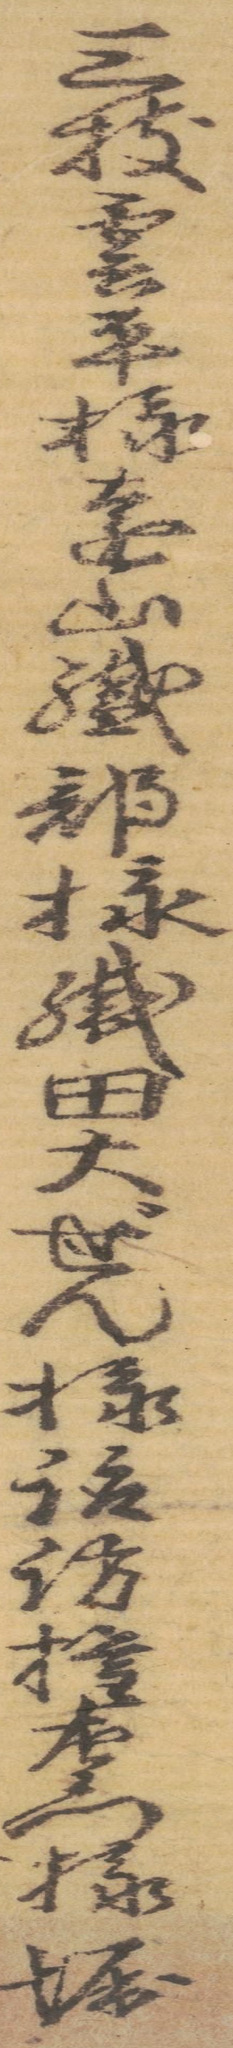三枝雲平様遠山織部様織田大ぜん様諏訪権左衛門様堀
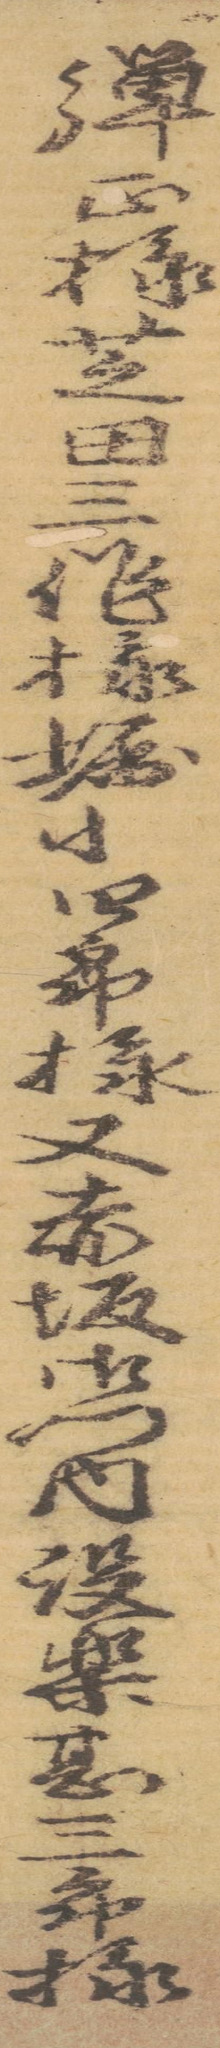弾正様芝田三作様堀小四郎様又赤坂御門内設楽甚三郎様
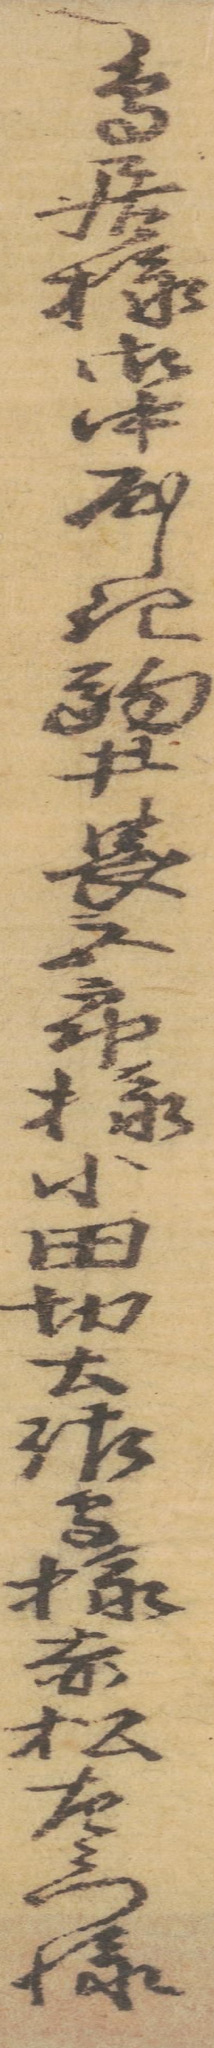鳥居様御中やしき駒井長五郎様小田切土佐守様赤松左衛門様
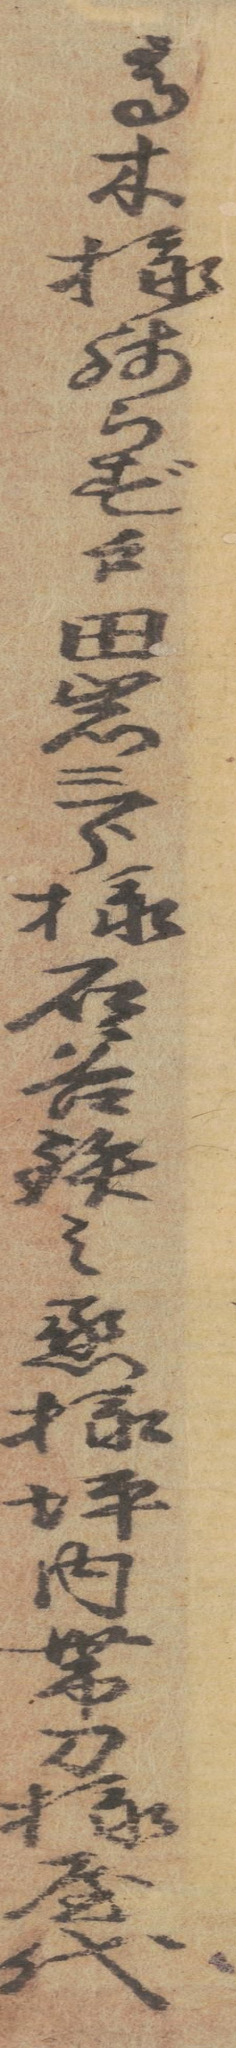高木様残らず戸田岩三郎様石谷鉄之丞様坪内帯刀様屋代
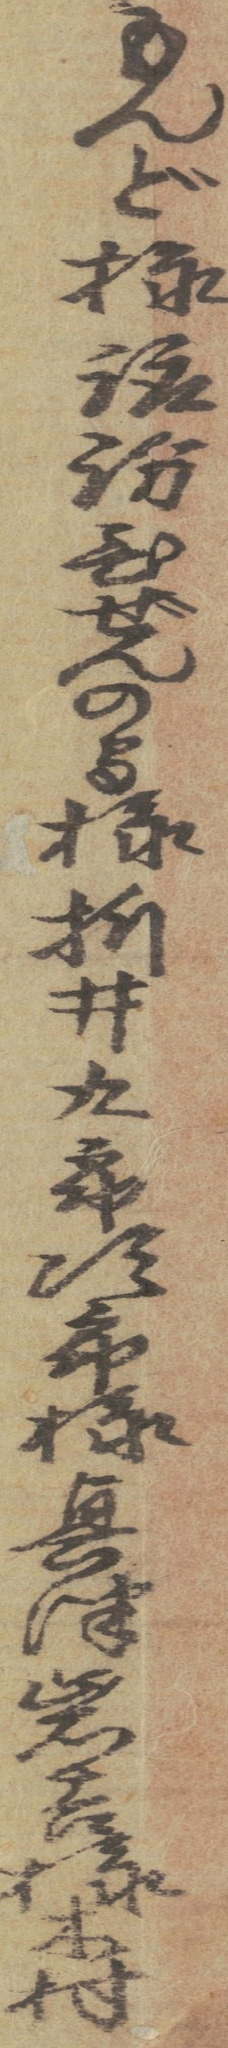もんど様諏訪ひぜんの守様折井九郎次郎様奥津岩吉様木村
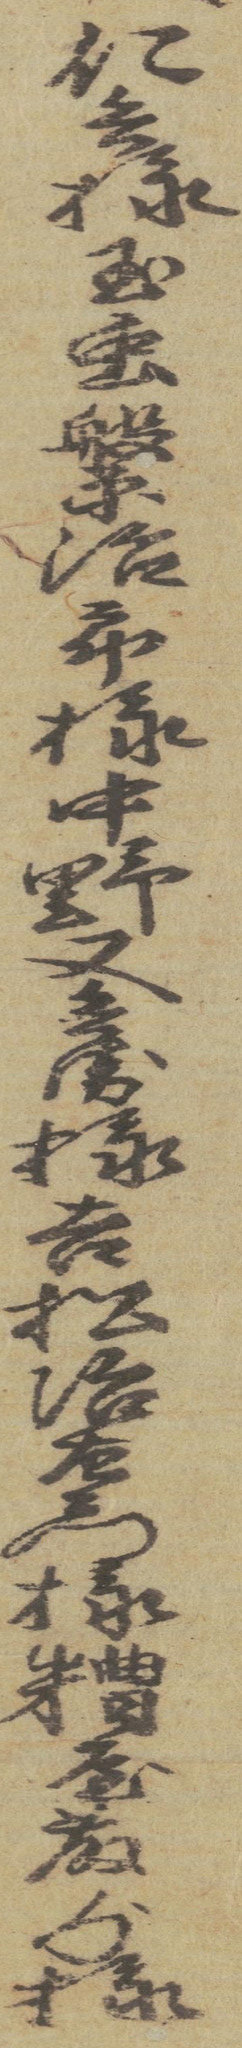仁兵様玉虫繁治郎様中野又兵衛様吉松治左衛門様糟屋藤衛門様
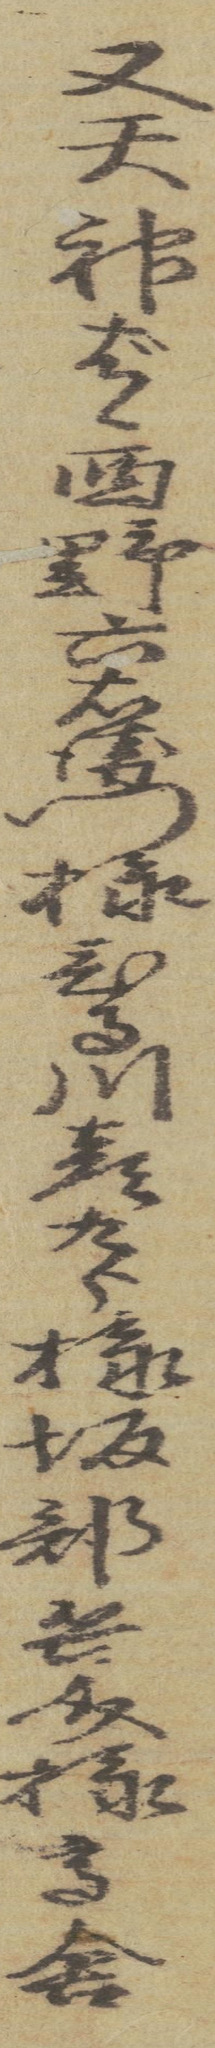又天神ばし西野六右衛門様ひる川彦九郎様坂部兵介様高倉
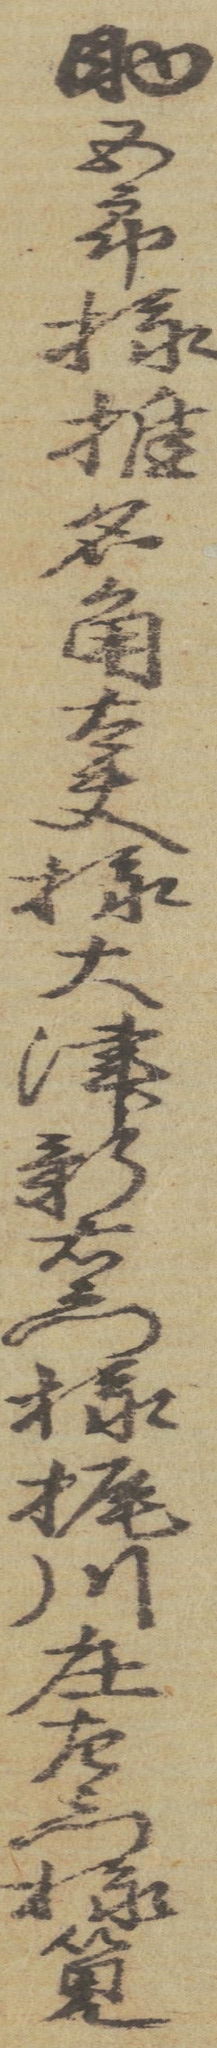助五郎様椎名角大夫様大津新右衛門様梶川庄左衛門様筧
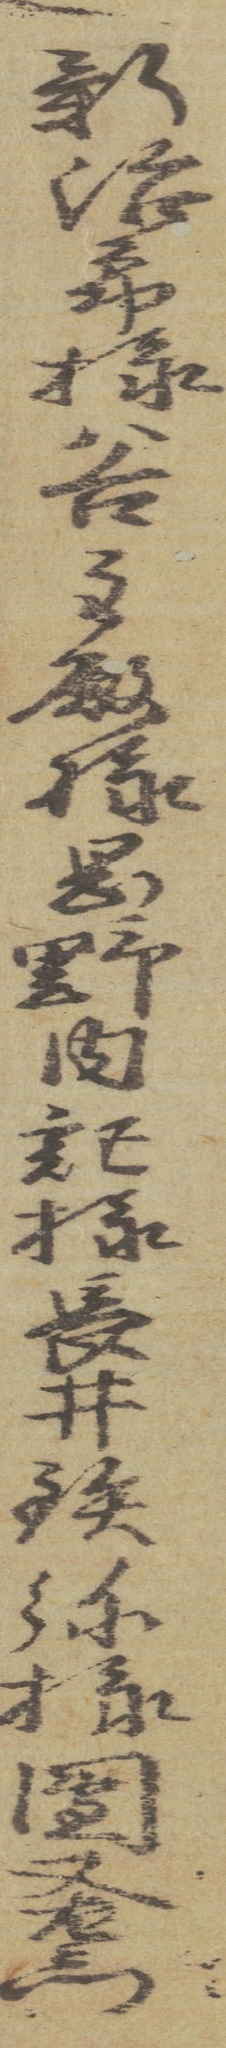新治郎様谷主殿様岡野内記様長井鉄弥様團又左衛門
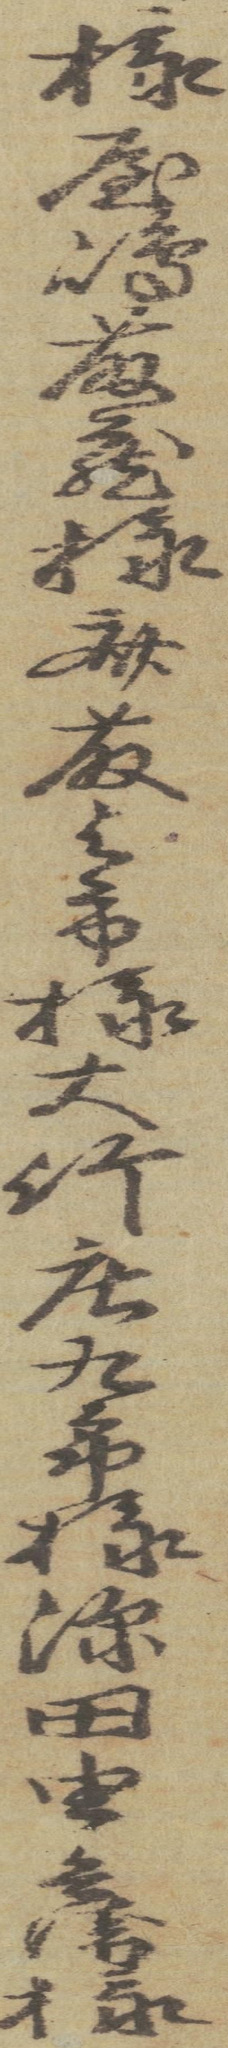様屋嶋藤蔵様斉藤与市様大竹庄九郎様深田由兵衛様
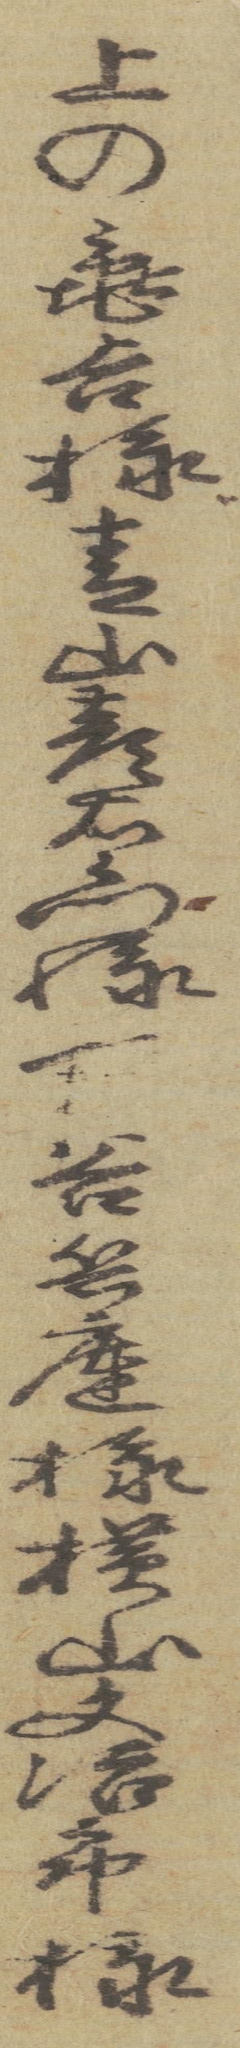上の亀吉様青山彦右衛門様下？谷兵庫様横山文治郎様
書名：類焼道しるべ
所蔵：東京大学地震研究所図書室 Earthquake Research Institute Library, The University of Tokyo, JAPAN
